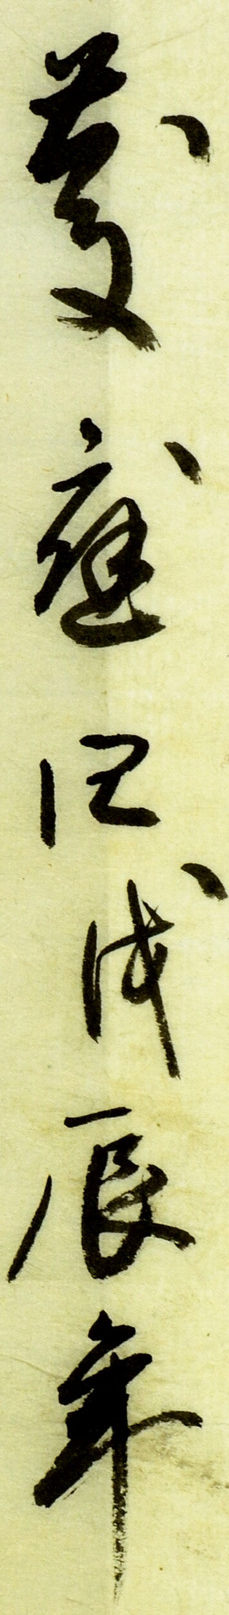慶應四戊辰年

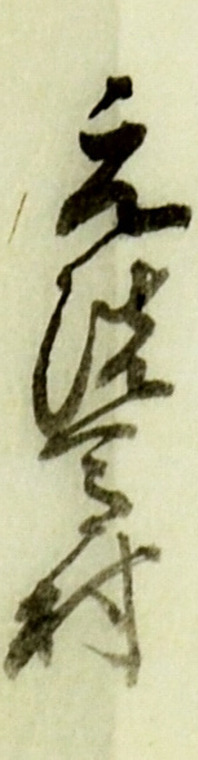元洗馬村
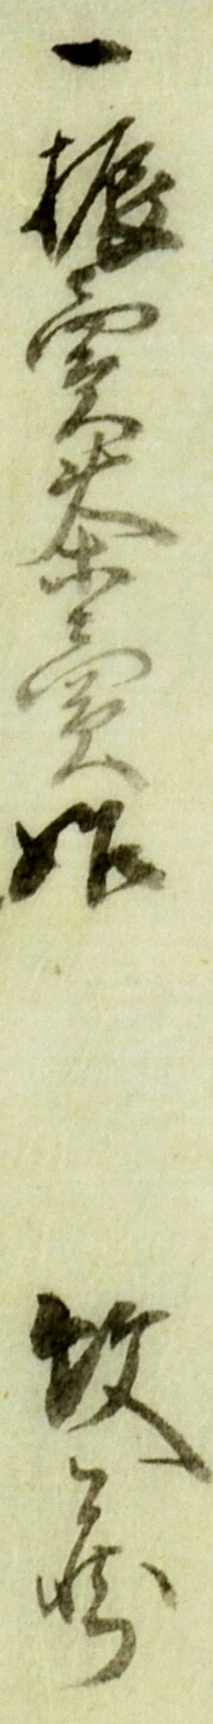一振売茶売始牧蔵
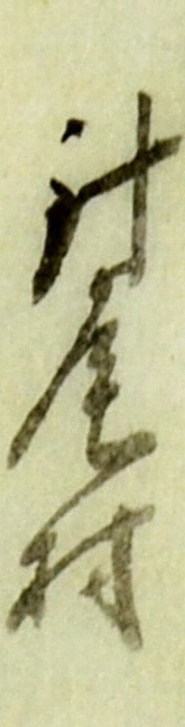針尾村
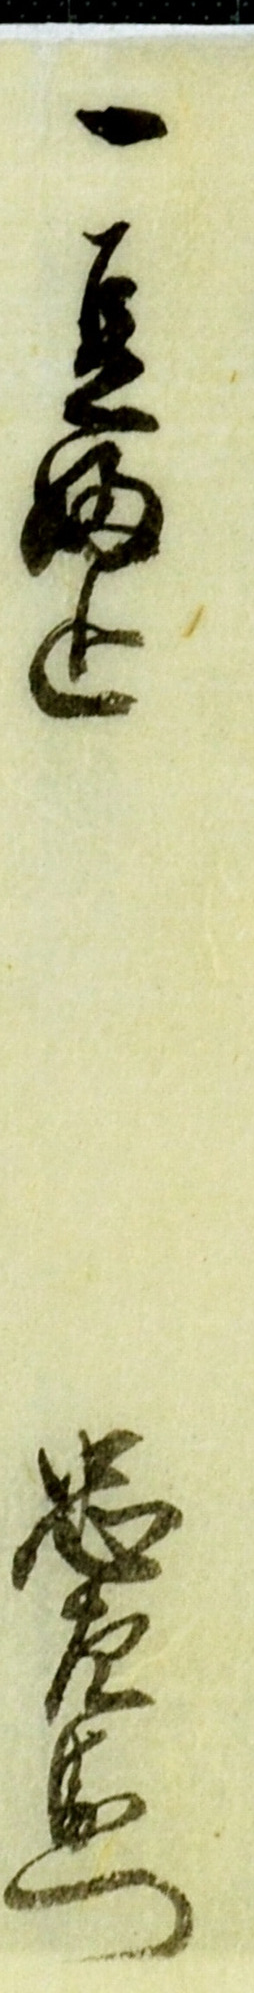一豆婦止忠左衛門
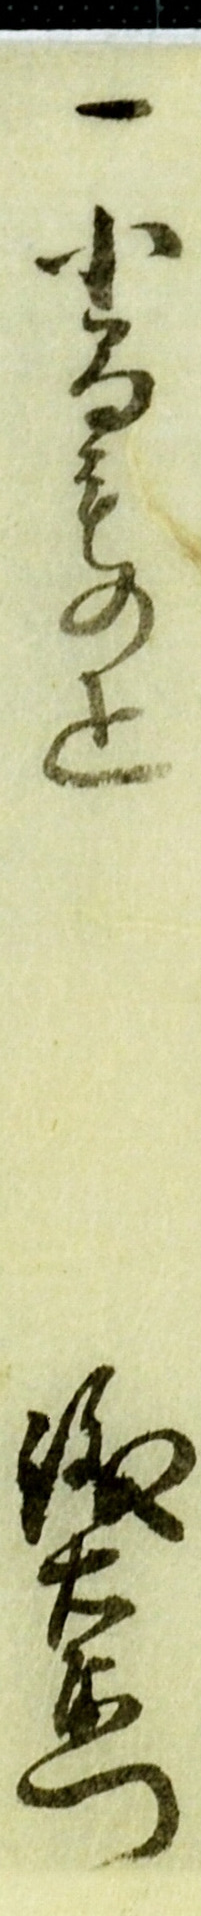一小間もの止儀右衛門
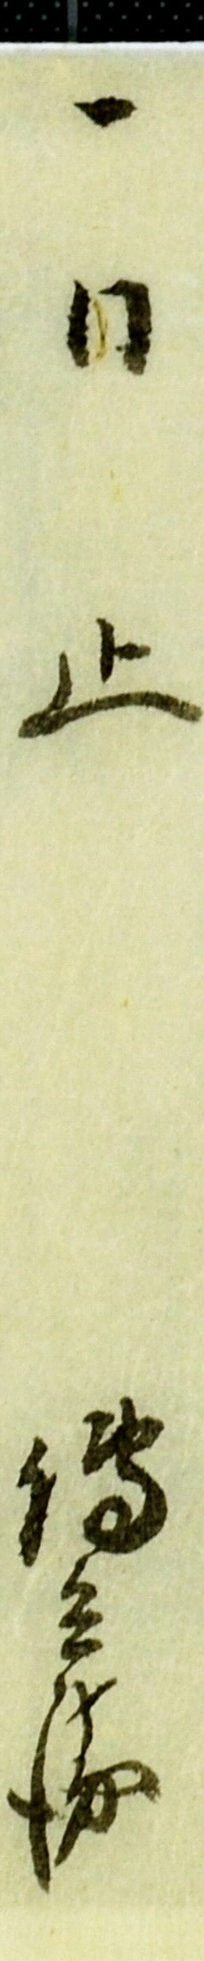一同止伝兵衛
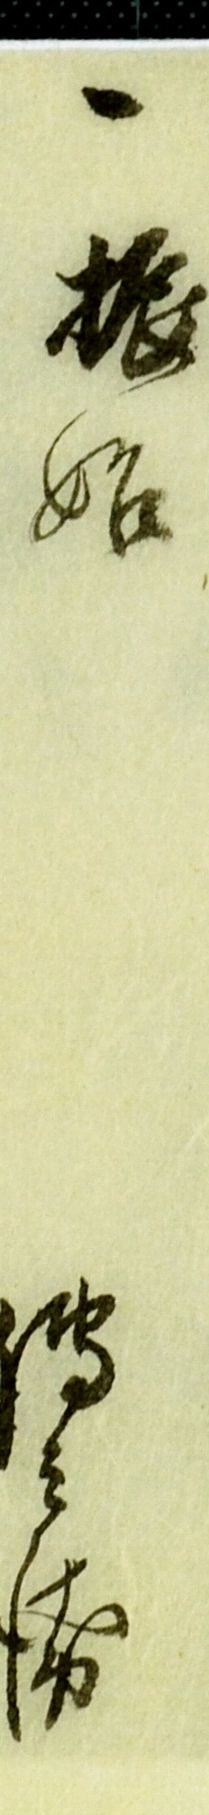一振始伝兵衛
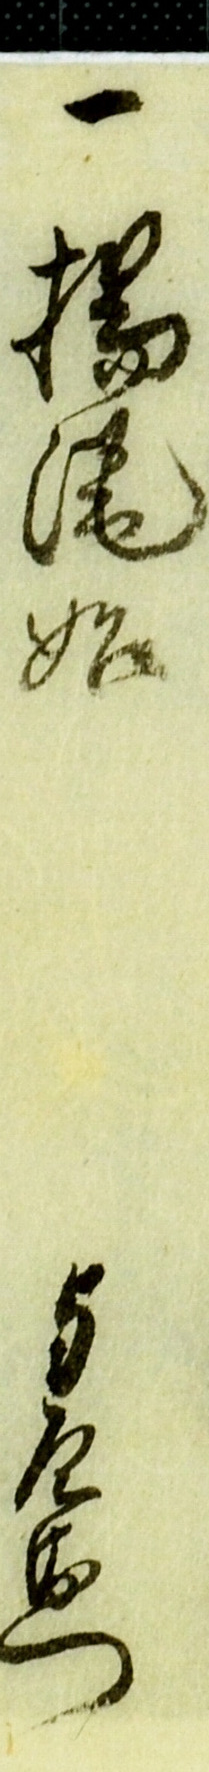一揚縄始与左衛門
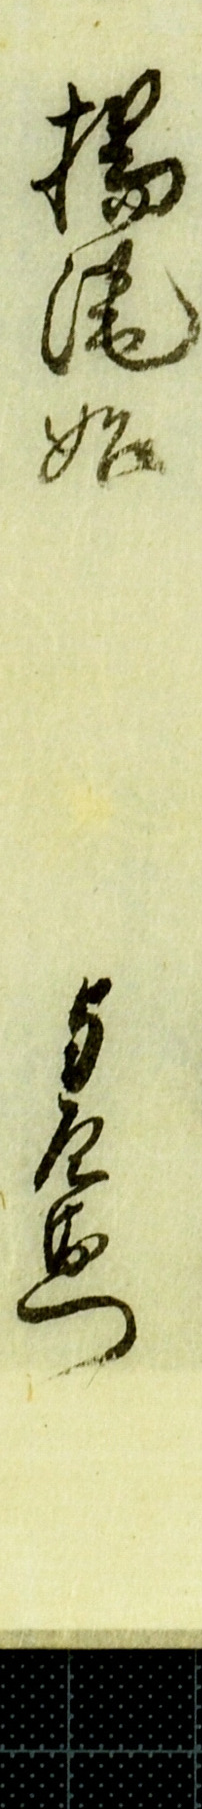一揚縄始与左衛門
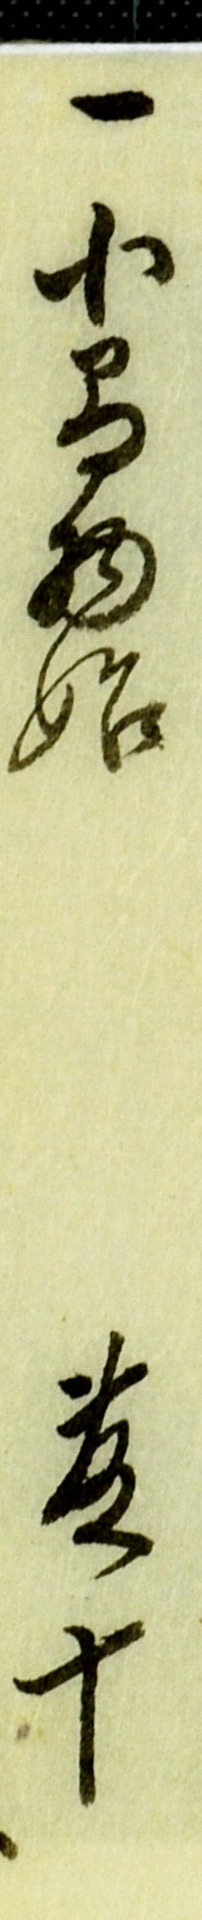一小間物始藤十
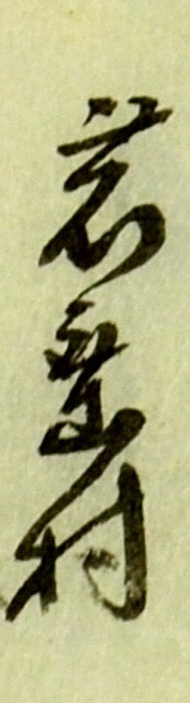岩垂村
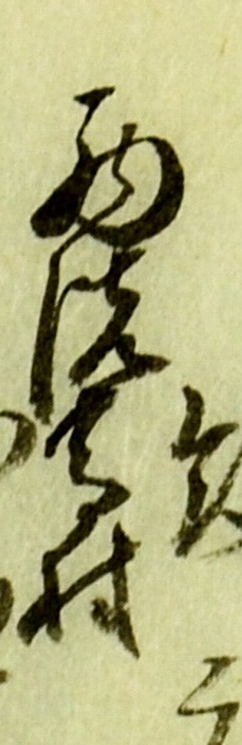西洗馬村
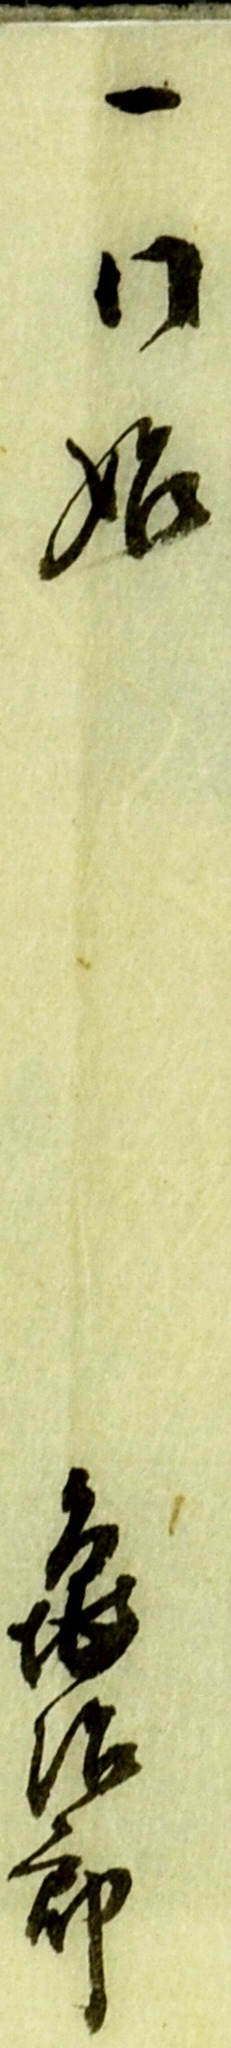一同始亀治郎
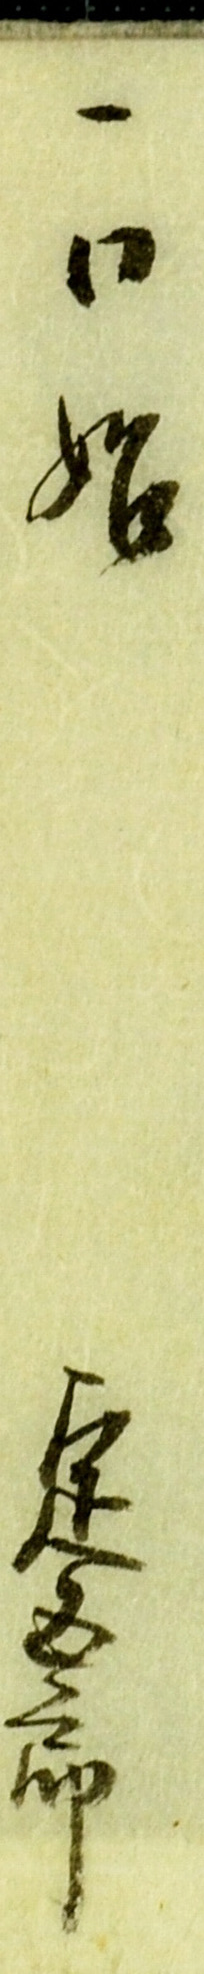一同始定五郎
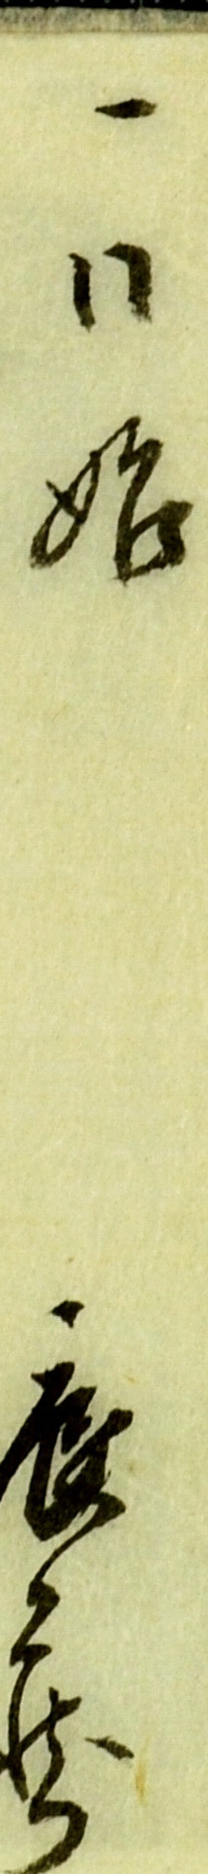一同始辰蔵
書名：郷方掛合帳
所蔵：伊那市立高遠町図書館・合同会社AMANE
